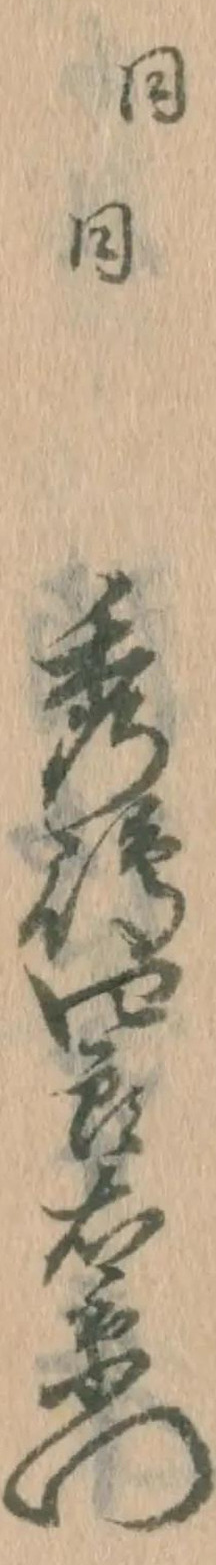同同秀島四郎右衛門
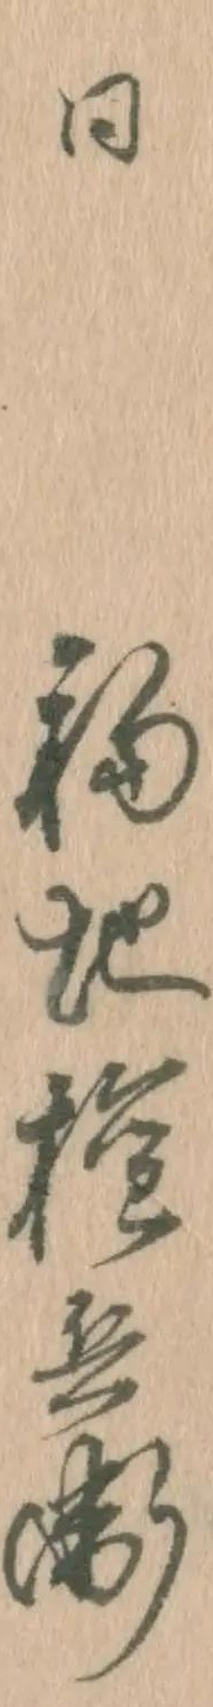同福地権兵衛
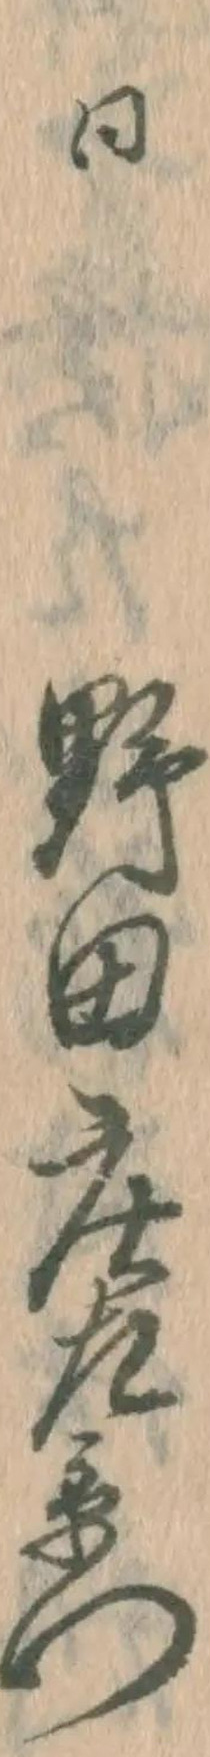同野田庄左衛門
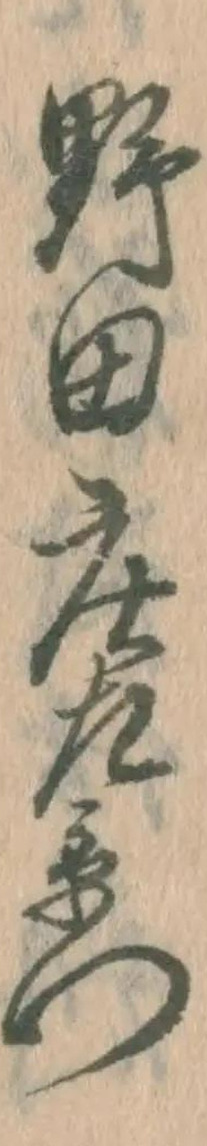同野田庄左衛門
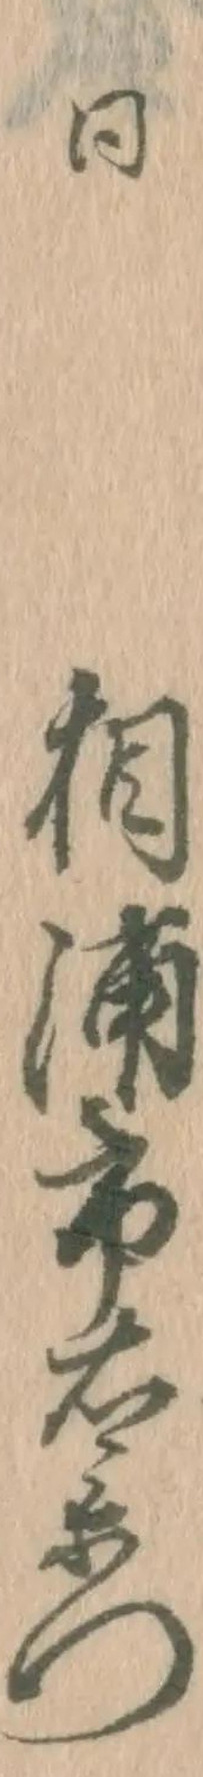同相浦市右衛門
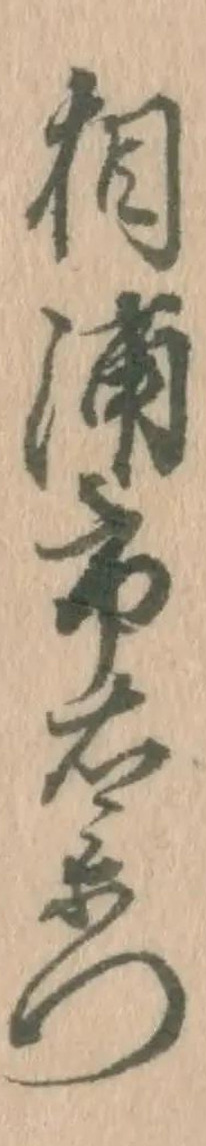同相浦市右衛門
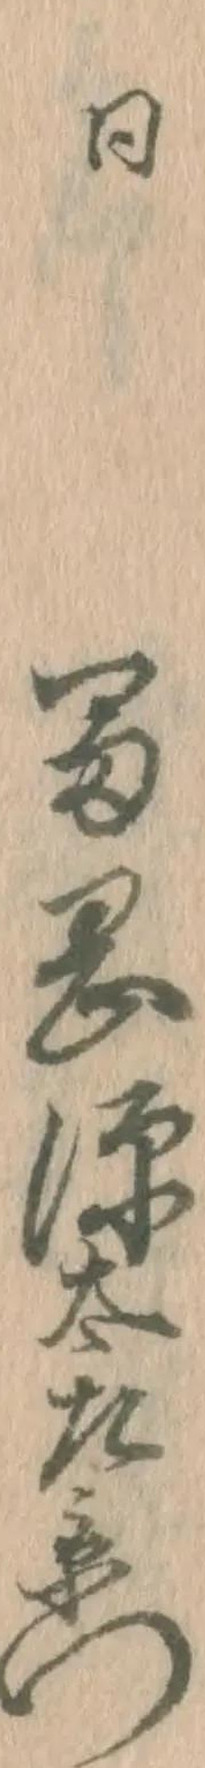同冨岡源太左衛門
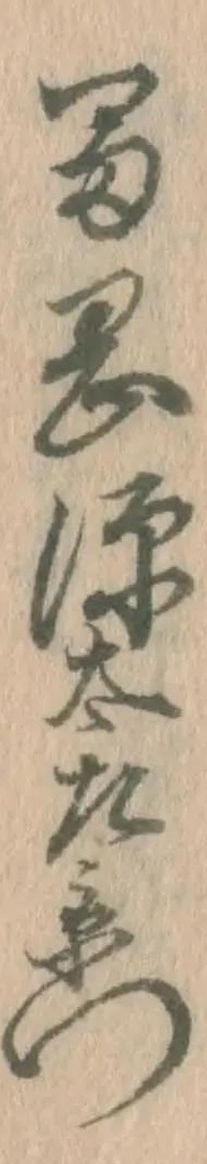同冨岡源太左衛門
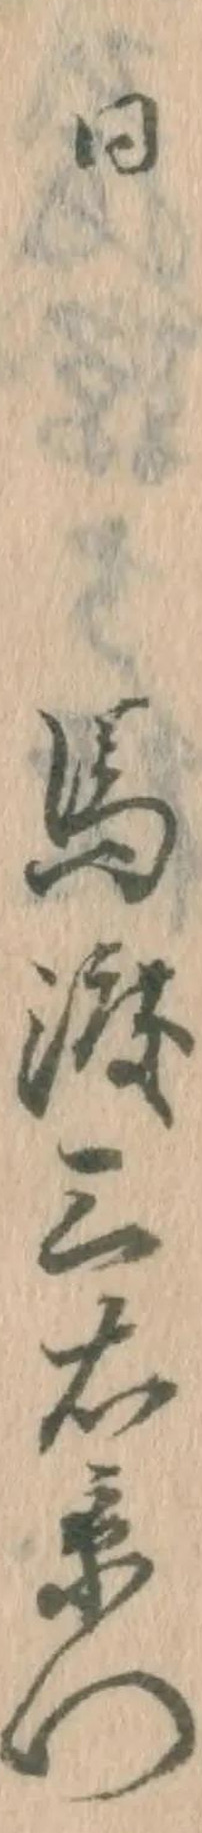同馬渡三右衛門
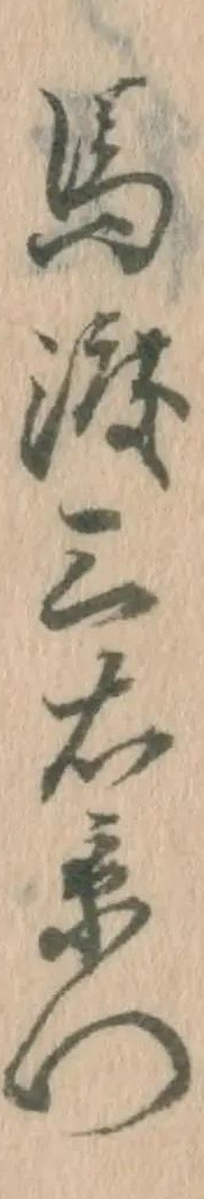同馬渡三右衛門
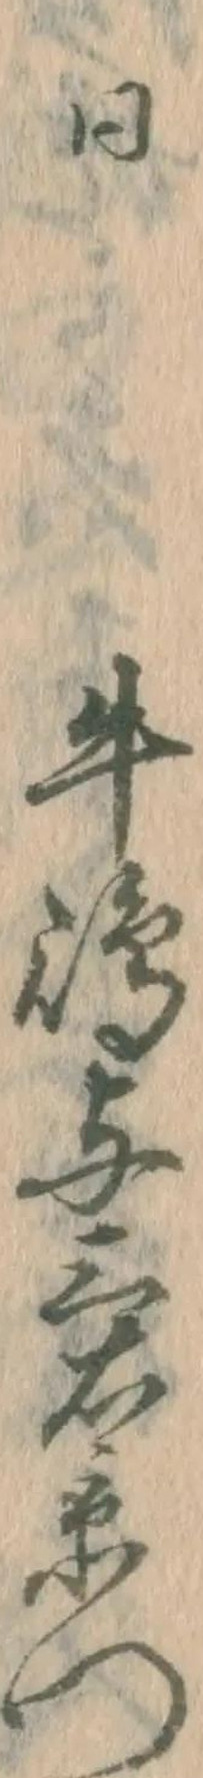同牛島与三右衛門
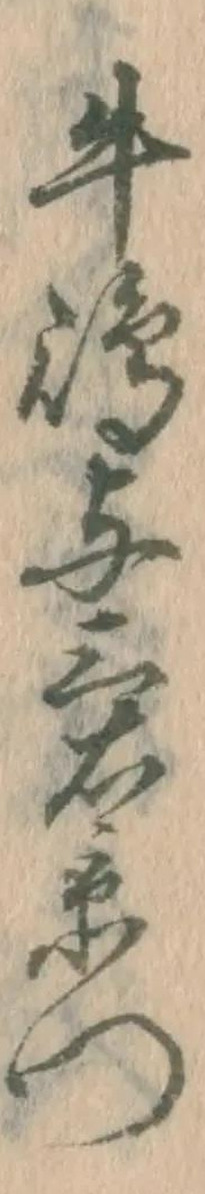同牛島与三右衛門
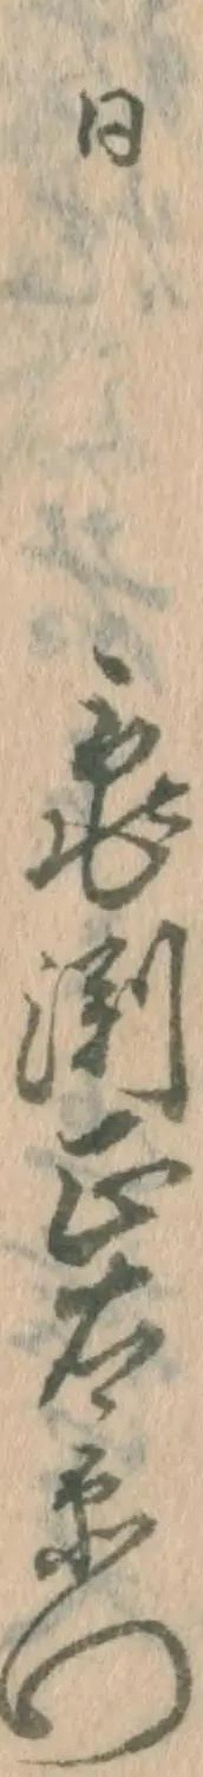同亀渕正右衛門
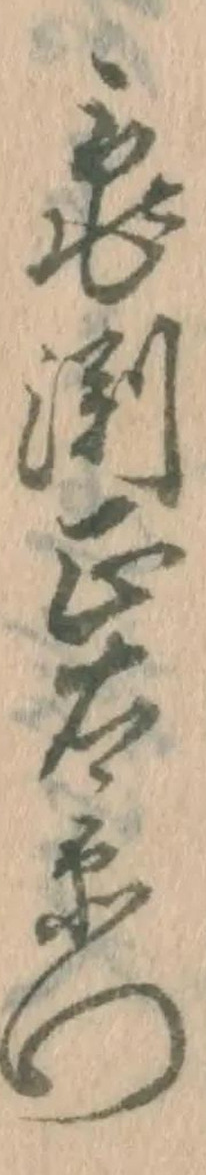同亀渕正右衛門
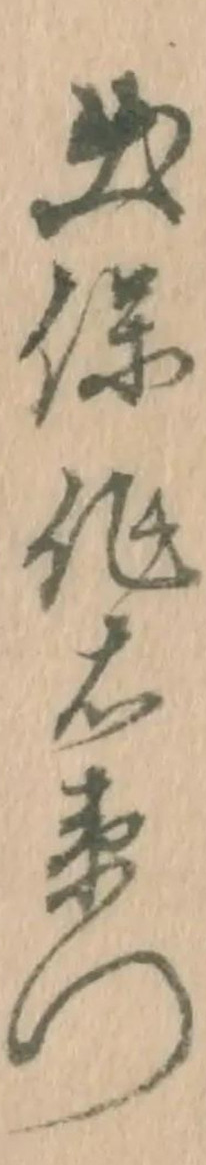同出保作右衛門

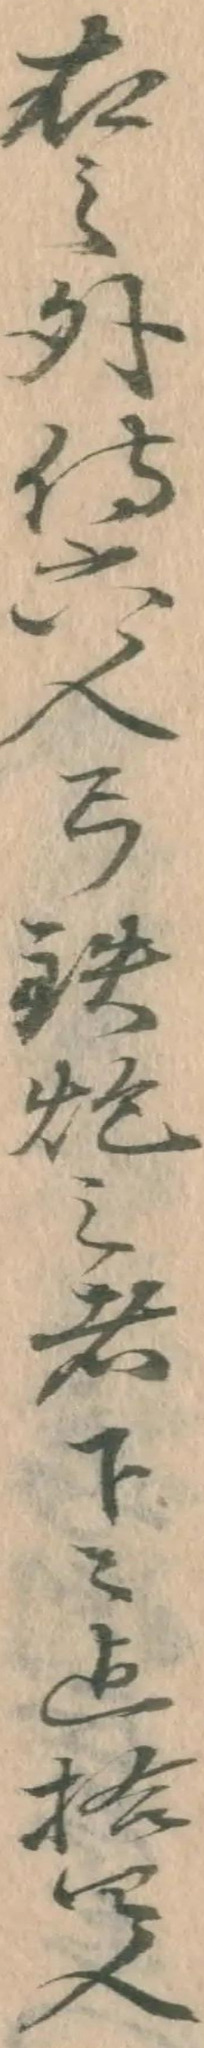右之外侍六人弓鉄炮之者下々迄拾四人
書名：切支丹御退治記 49巻. [7]
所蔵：国立国会図書館 National Diet Library, JAPAN
